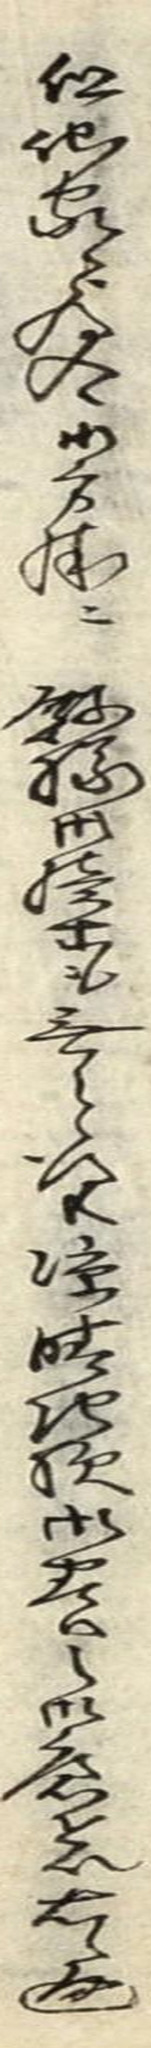但他家へ被為入候御方殊に殿様御続等も無之候得共涼晴院様御養之御廉を以右之通
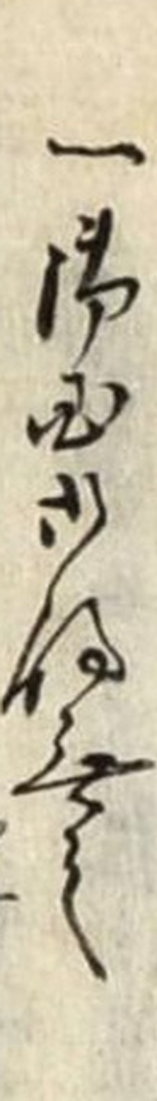一御国御触無之
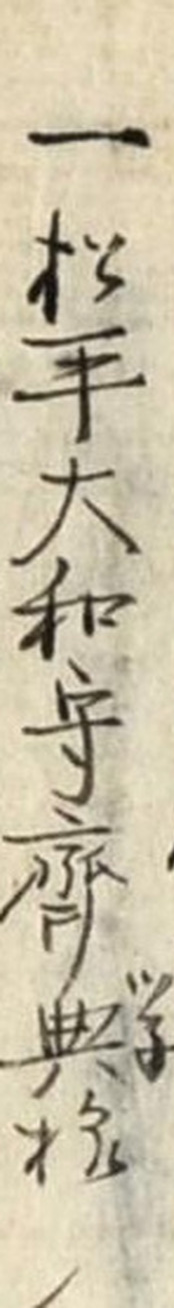一松平大和守斉典様
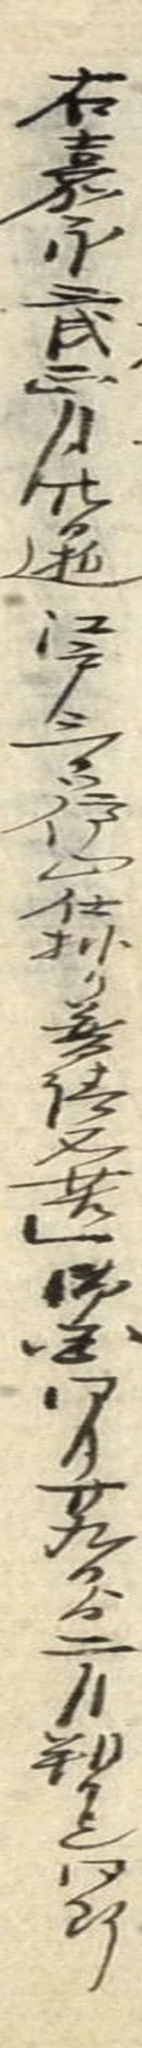右嘉永三戌正月廿日逝江戸三日御停止仕懸り普請不苦」御国同月廿九日ゟ二月朔日迄同断

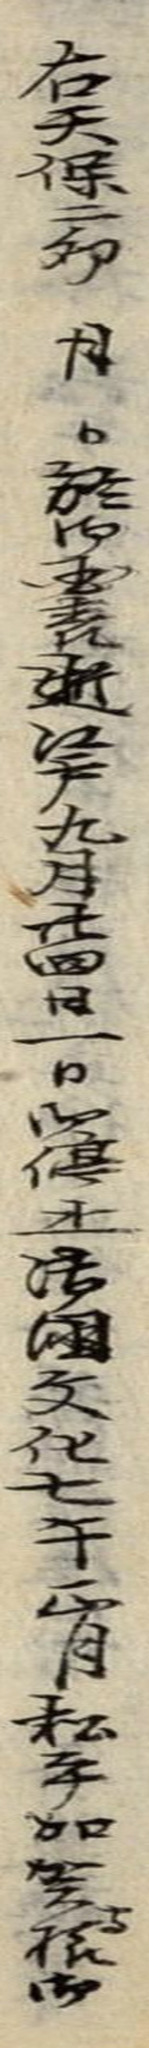右天保二卯月日於御国表逝江戸九月廿四日一日御停止御国文化七午正月松平加賀守様御
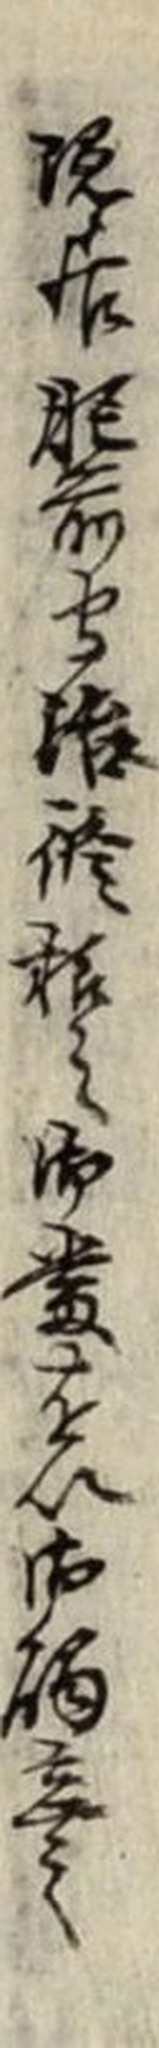隠居肥前守治修様之御当を以御触無之
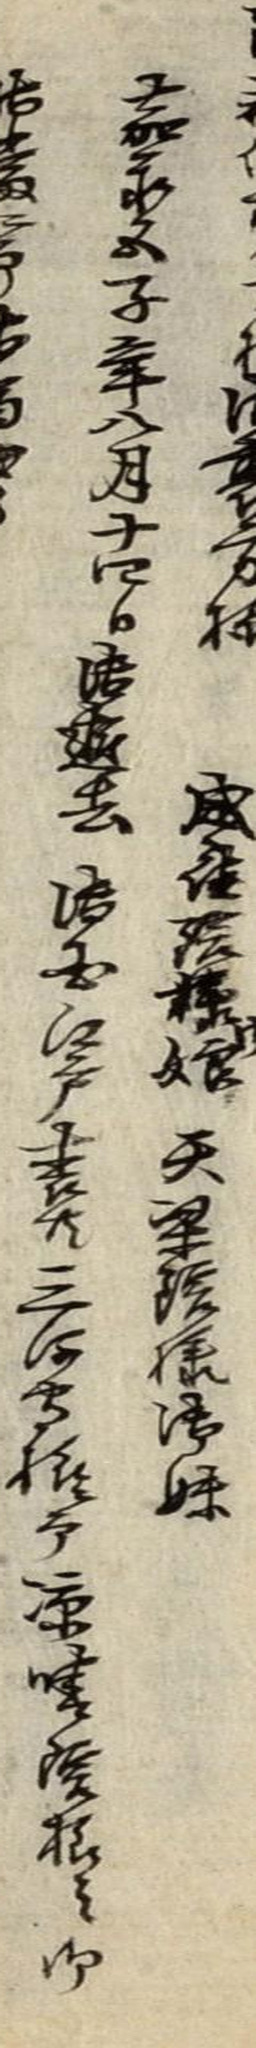嘉永五子年八月十四日御逝去御国江戸表共三河守様にて涼晴院様之御
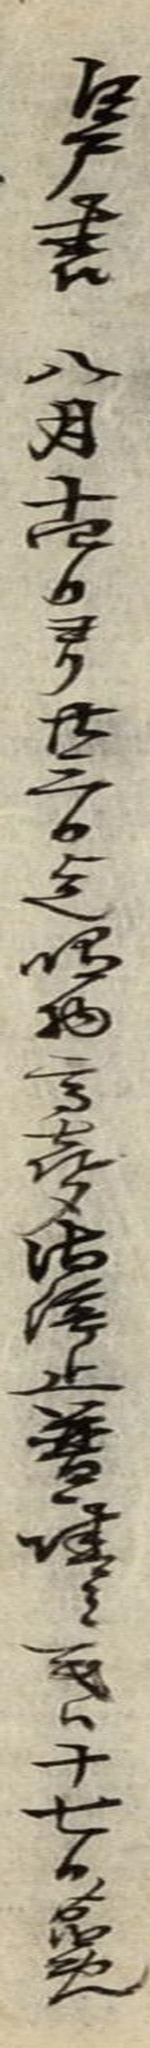江戸表八月十四日ヨリ廿三日迄鳴物高声御停止普請之義は十七日ゟ御免
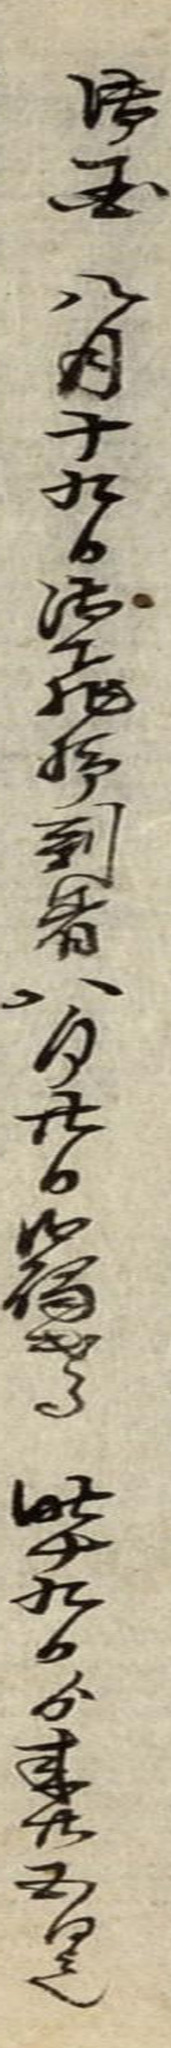御国八月十九日御飛脚到着八月廿日御触出る昨十九日ゟ来廿五日迄
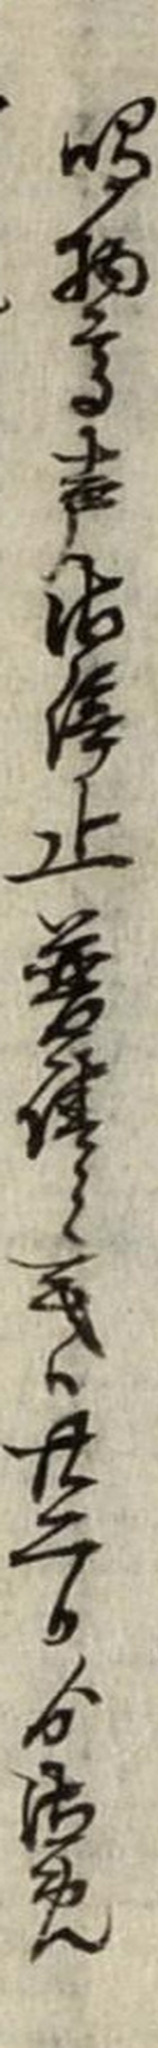鳴物高声御停止普請之義は廿二日ゟ御免
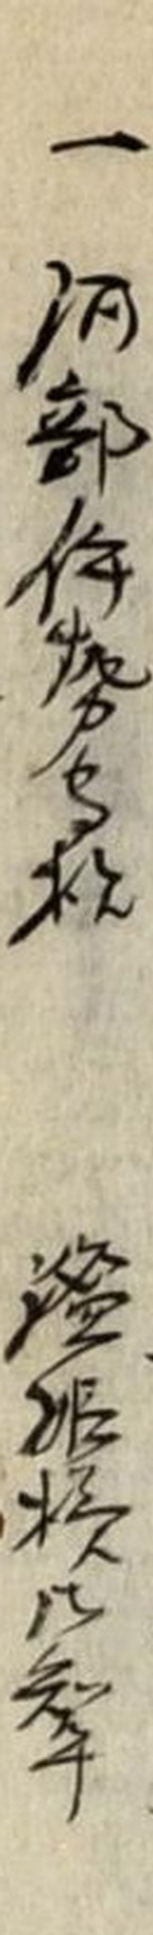一阿部伊勢守様謐姫様御聟

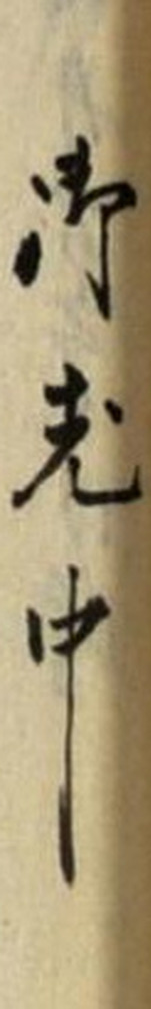御老中
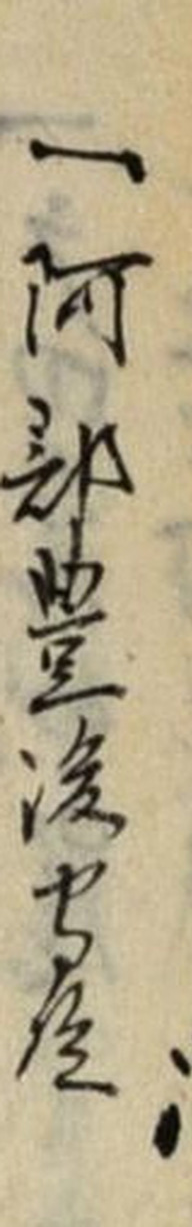一阿部豊後守殿
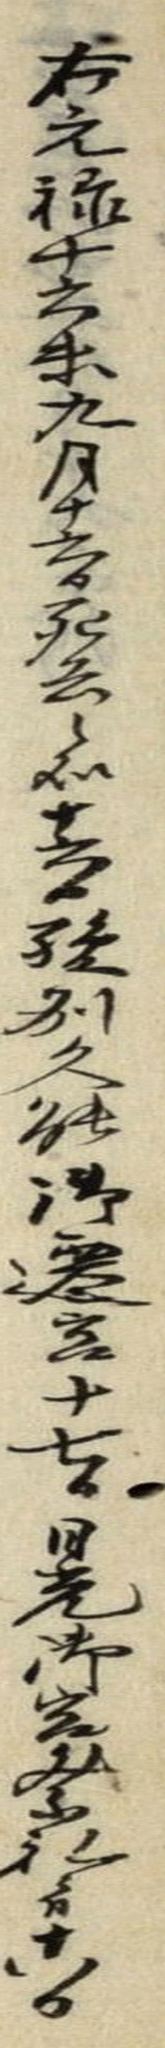右元禄十六未九月十六日死去之処十六日駿州久能御遷宮十七日日光御宮祭礼に付十八日
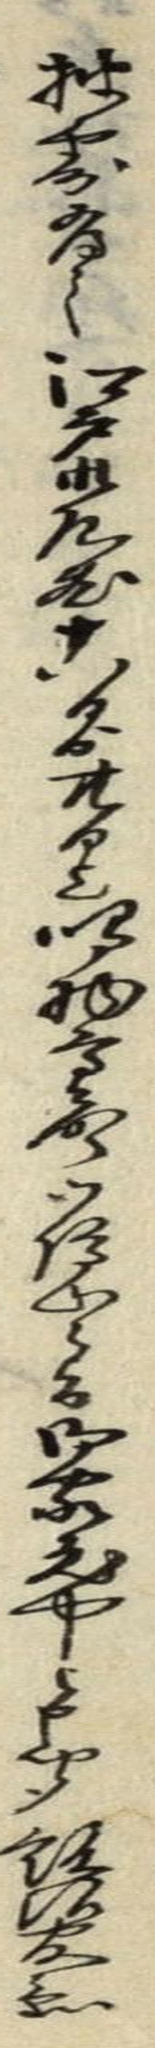披露有之江戸御屋敷十八日ゟ廿日迄鳴物高声御停止之旨御家老中被申聞飯沼官兵衛
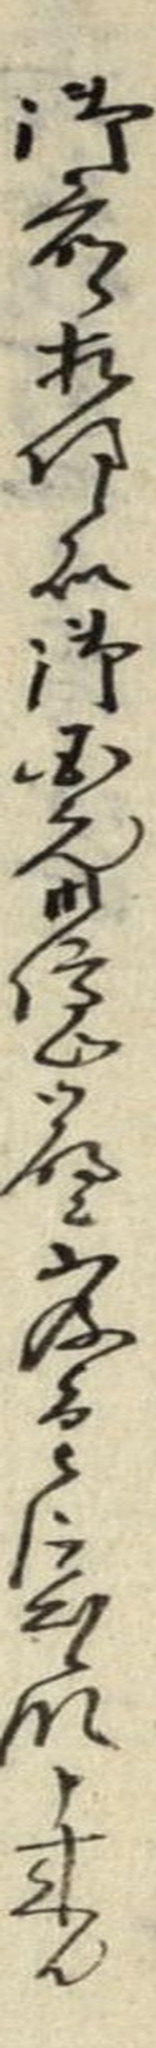御前へ相伺候処御国元御停止御触に不及旨被仰出候段申来ル
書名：御停止異変死失
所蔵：福井県文書館 Fukui Prefectural Archives
